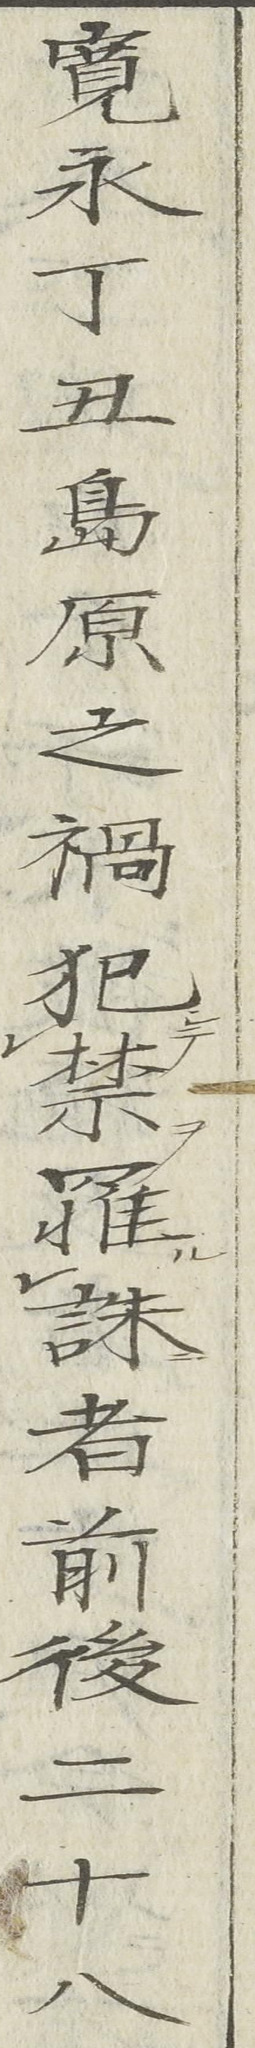寛永丁丑島原之禍犯禁罹誅者前後二十八
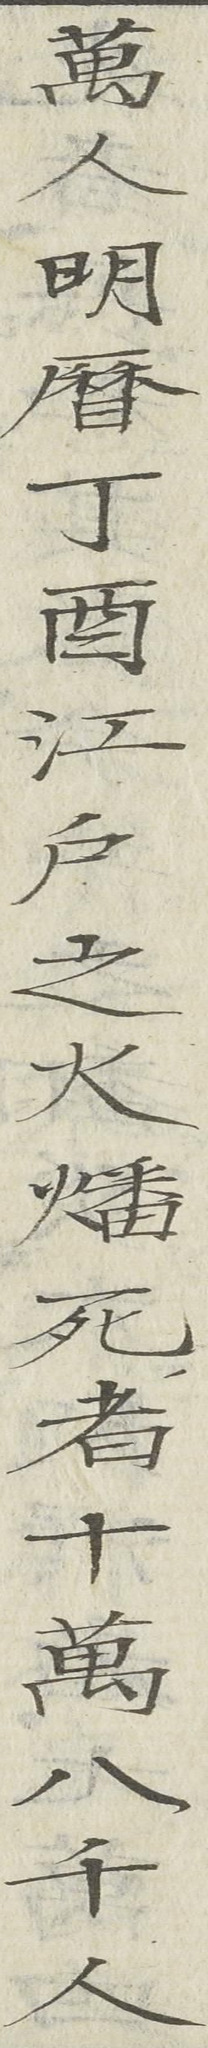萬人明暦丁酉江戸之火燔死者十萬八千人
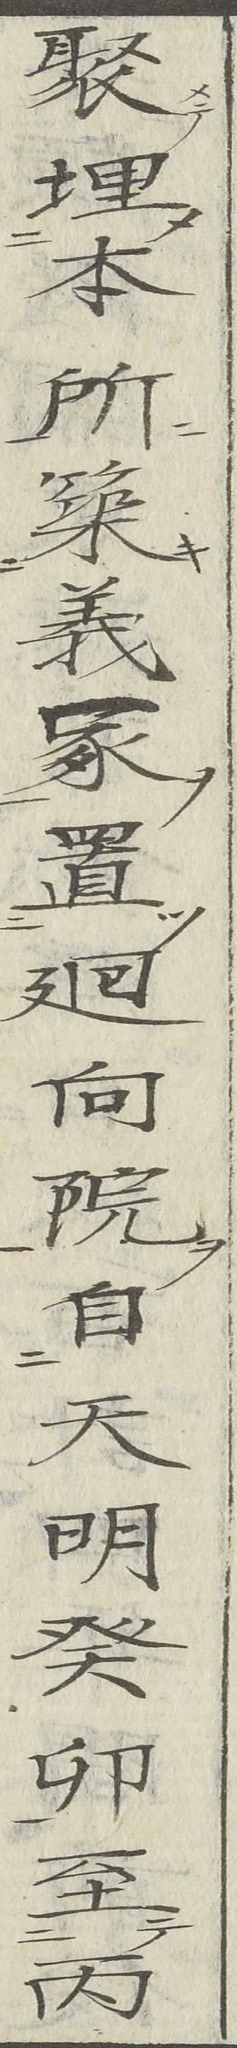聚埋本所築義冢置廻向院自天明癸卯至丙

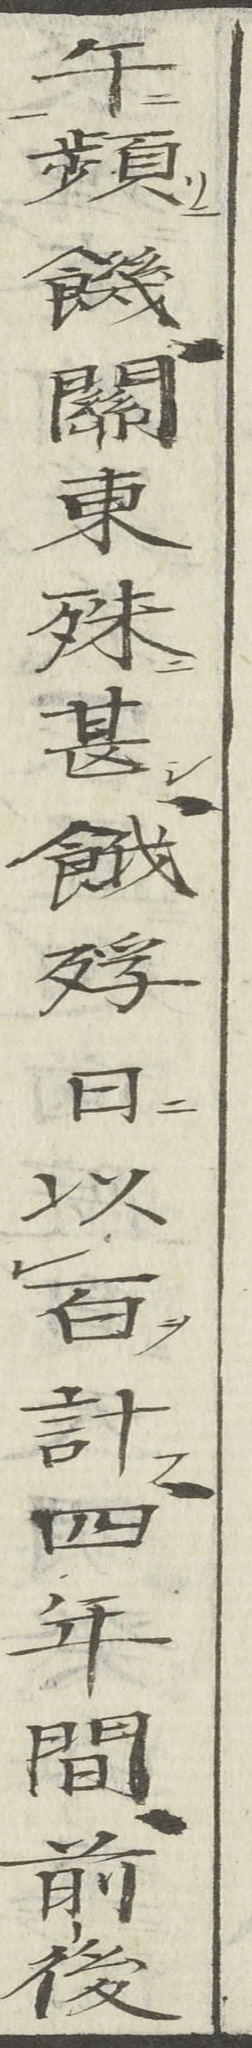午類饑、関東殊甚、餓殍日以百計、四年間、前夜
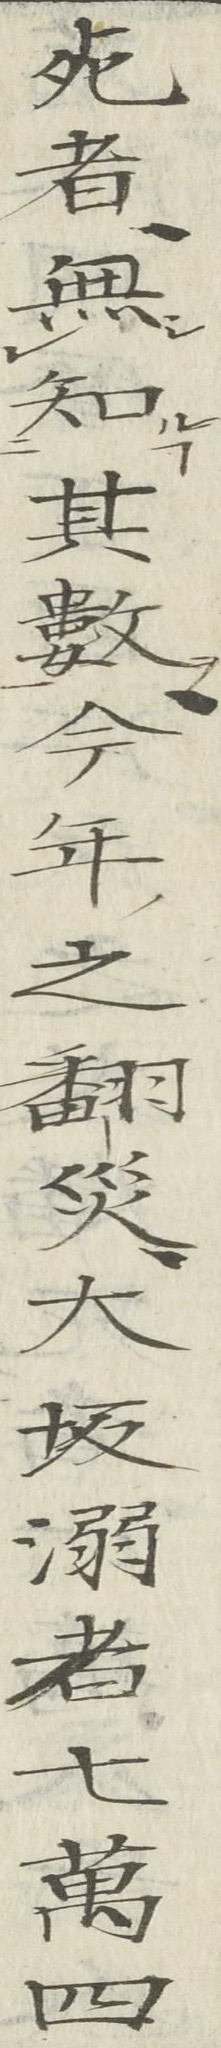死者、無知其数、今年之翻災、大坂溺者七萬四
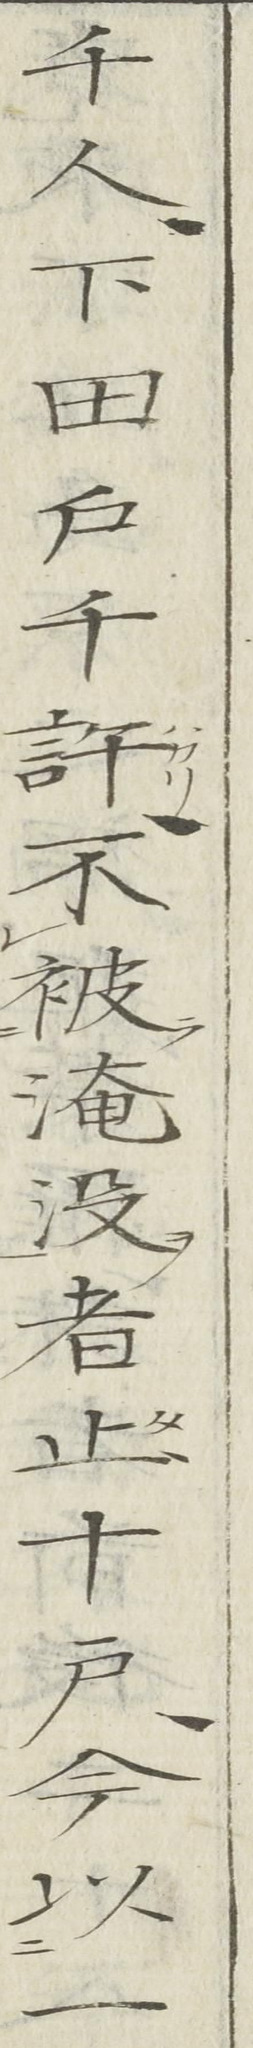千人、下田戸千許、不被淹没者止十戸、今以一
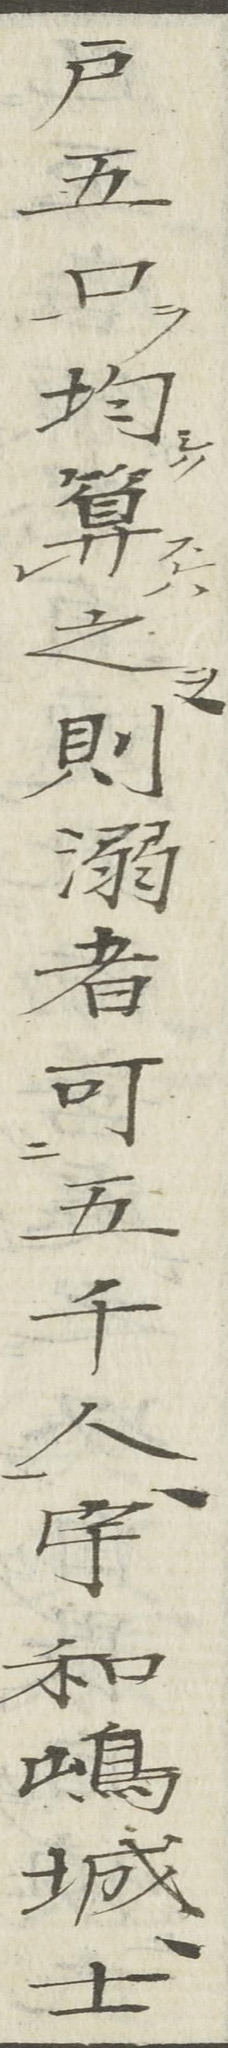戸五口均算之、則溺者可五千人、宇和嶋城、士
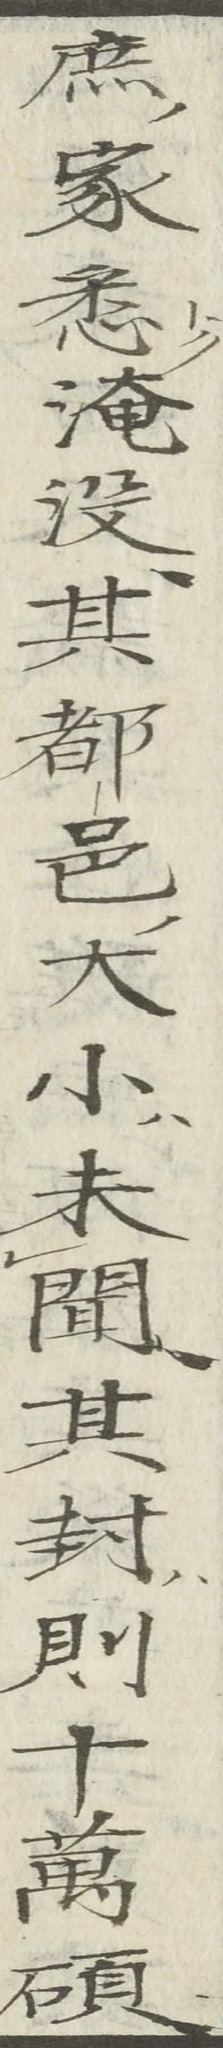庶家悉淹没、其都邑大小未聞、其封則十萬碩、
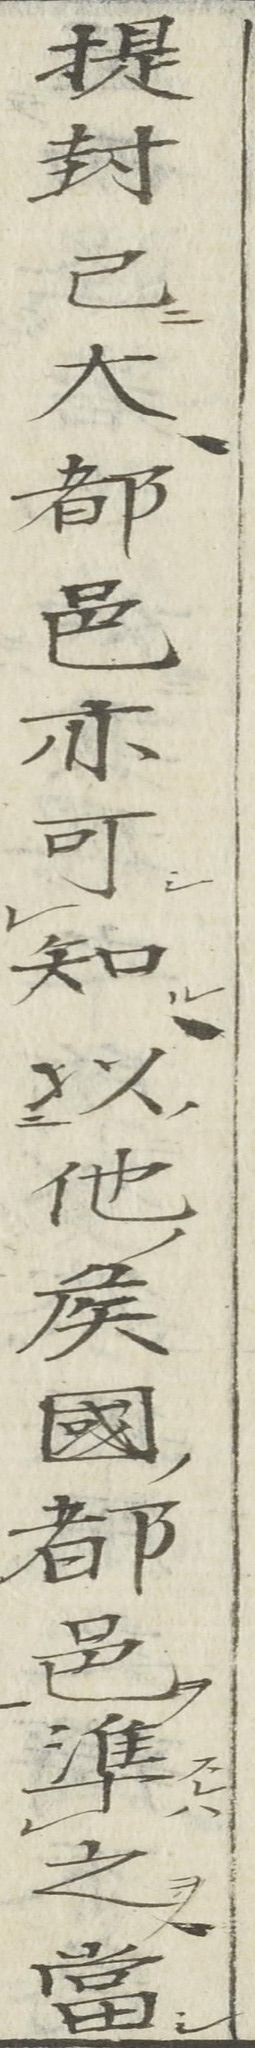提封已大、都邑亦可知、以他侯国都邑準之、当
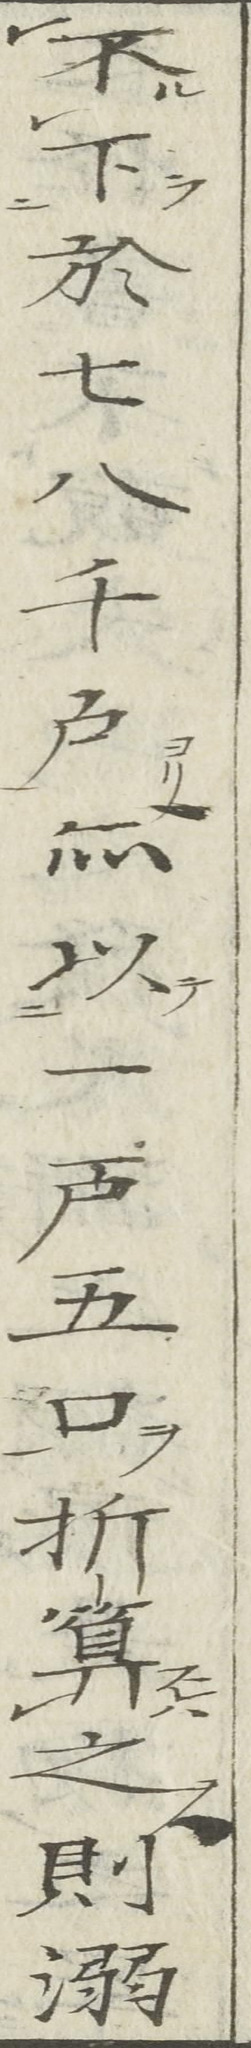不下於七八千戸、亦以一戸五口折算之、則溺
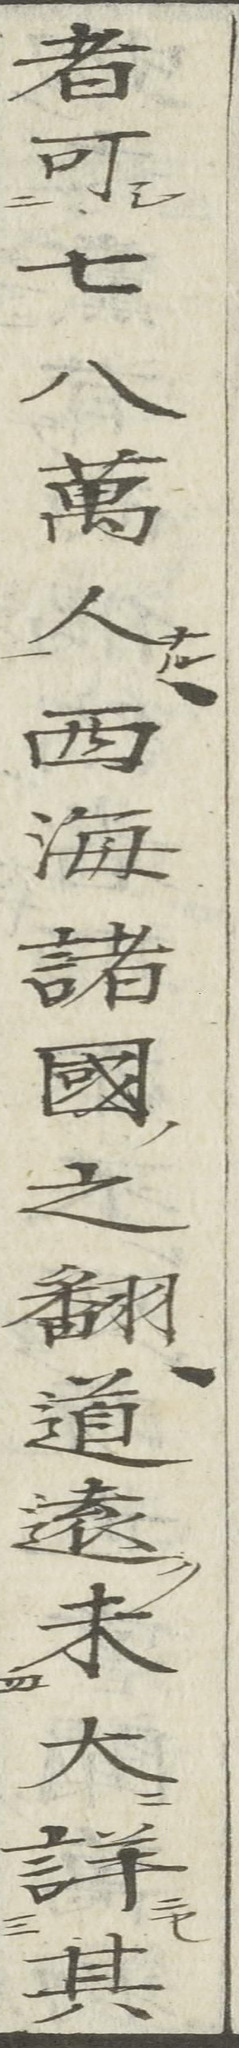者可七八萬人、西海諸国之翻、道遠未大詳其
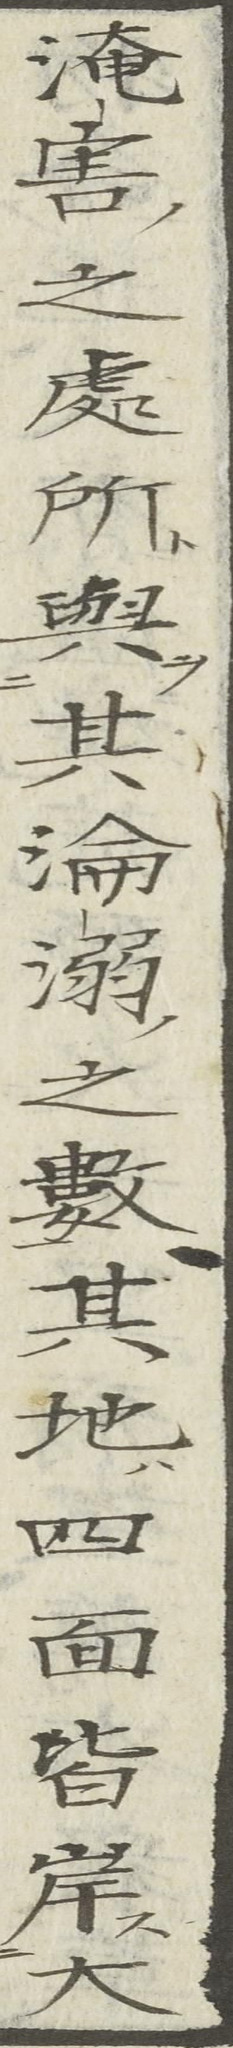淹害之処所輿其淪溺之数、其地四面皆岸大
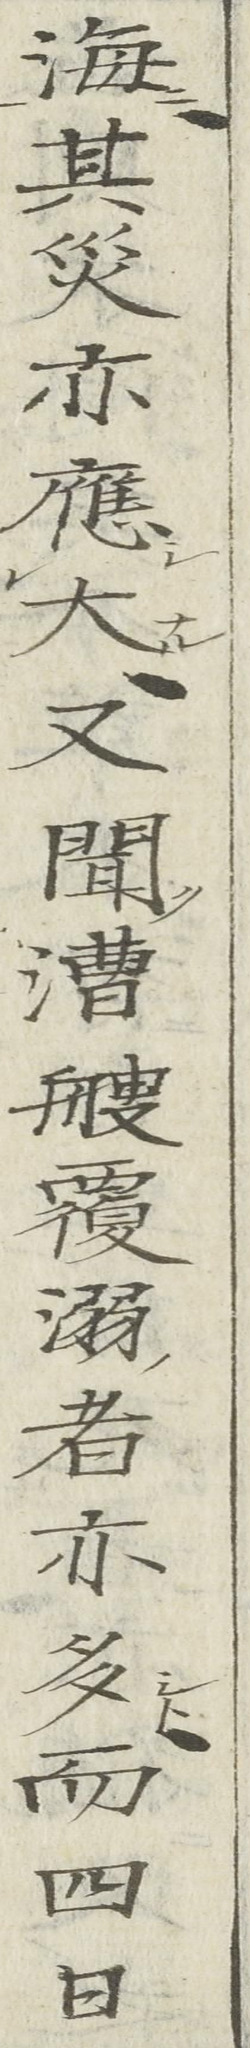海、其災亦應大、又聞漕艘覆溺者亦多、而四日
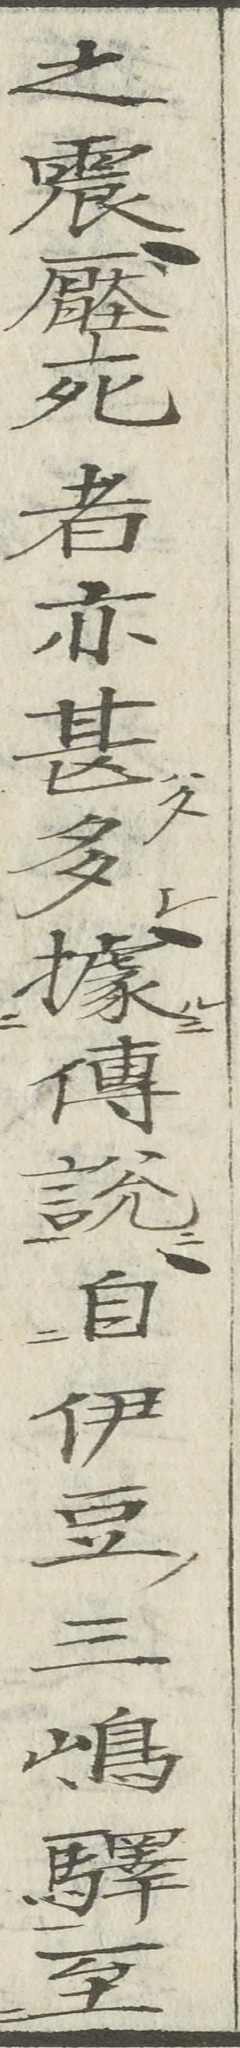之震、圧死者亦甚多、據伝説、自伊豆三嶋駅至
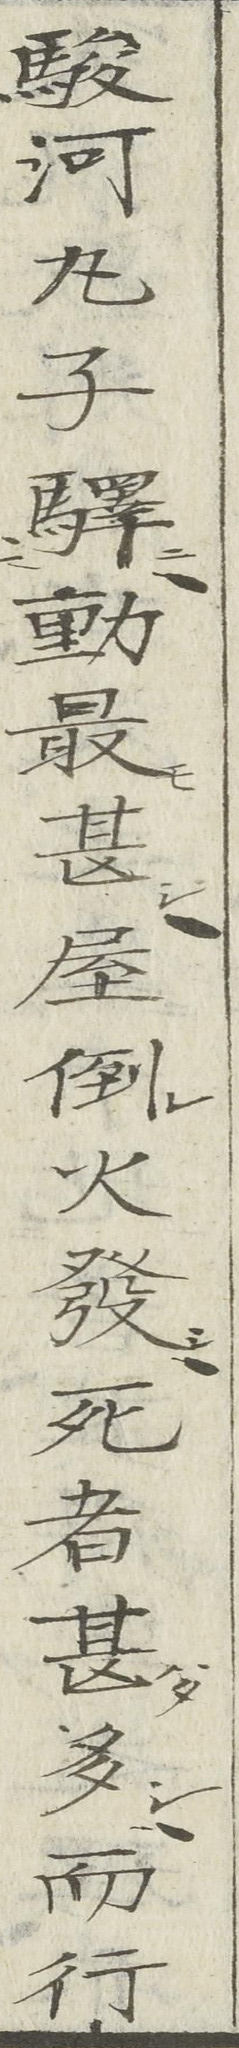駿河丸子駅、動最甚、屋倒火発、死者甚多、而行
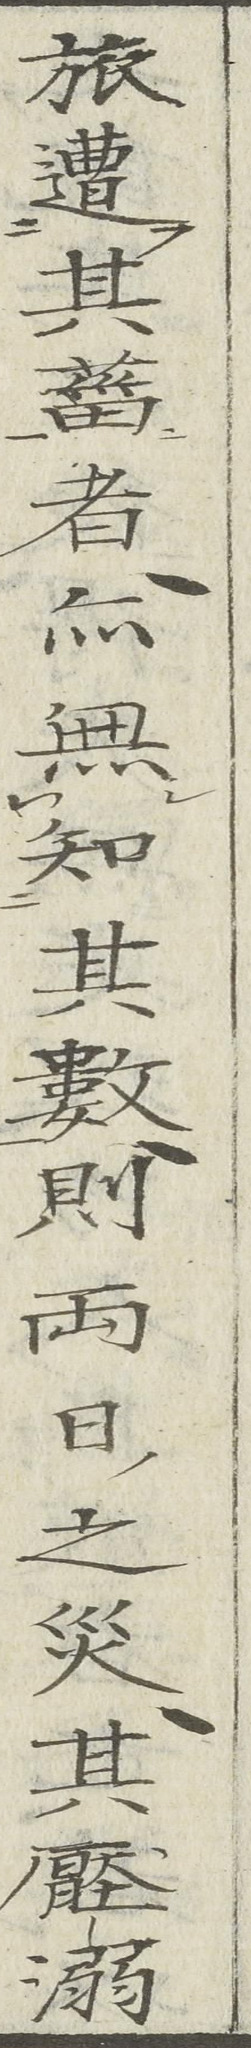旅遭其菑者、亦無知其数、則両日之災、其圧溺
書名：海翻考　全
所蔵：東京大学地震研究所図書室 Earthquake Research Institute Library, The University of Tokyo, JAPAN
